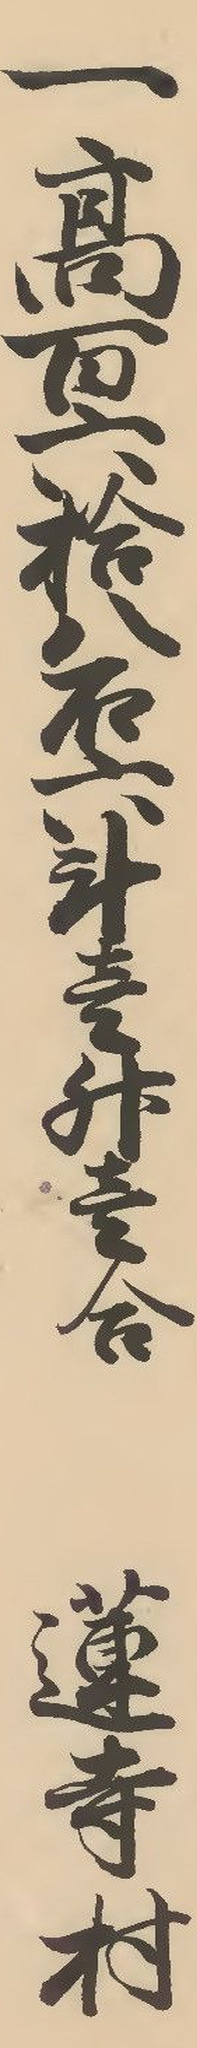一髙百六拾八石六斗壱升壱合蓮寺村
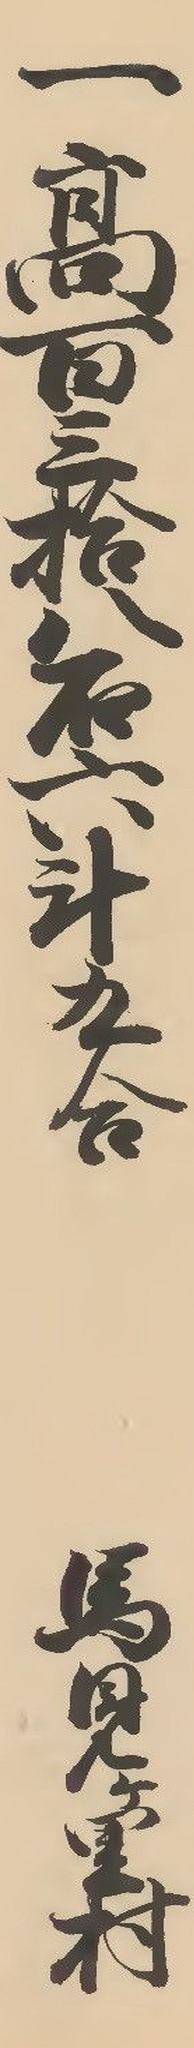一髙百三拾八石六斗九合馬見ケ里村
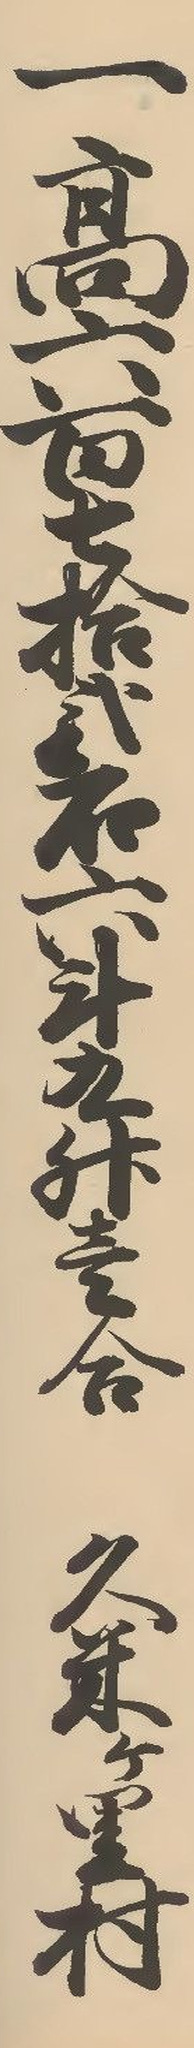一髙六百七拾弐石六斗九升壱合久米ケ里村
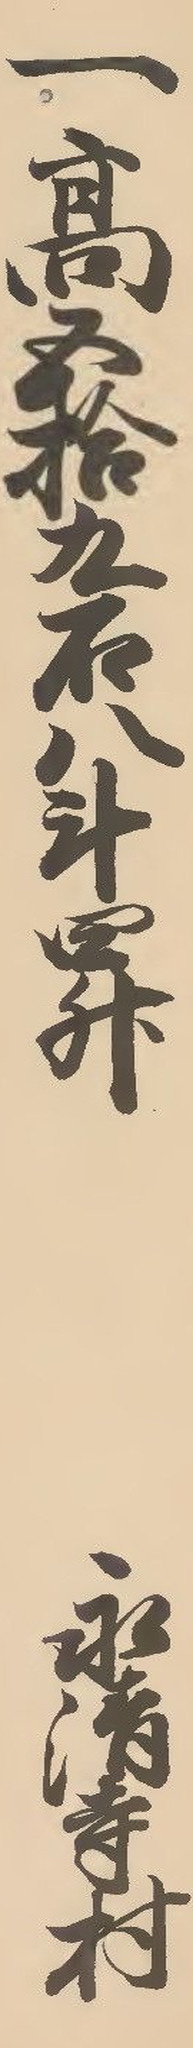一髙五拾九石八斗四升永清寺村
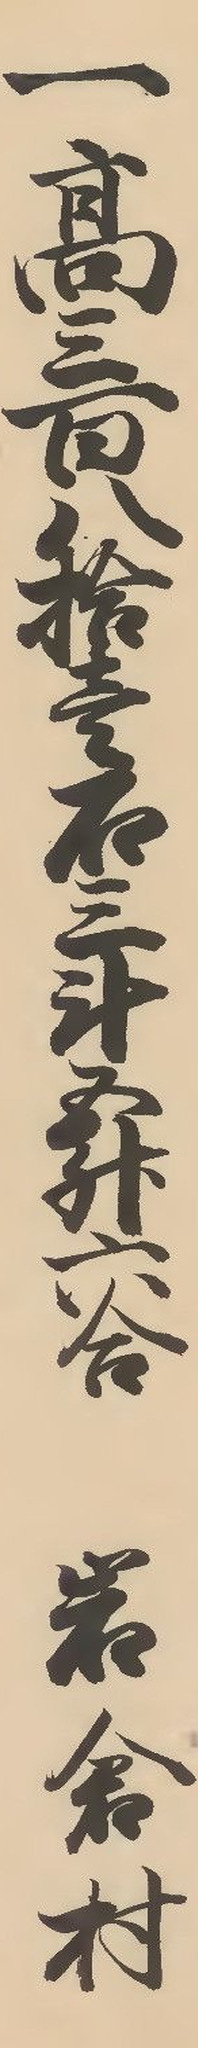一髙三百八拾壱石三斗五升六合岩倉村
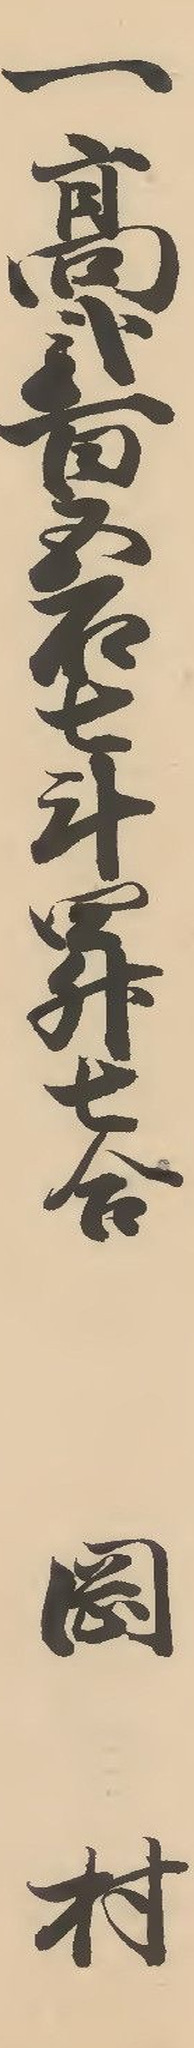一髙弐百五石七斗四升七合村
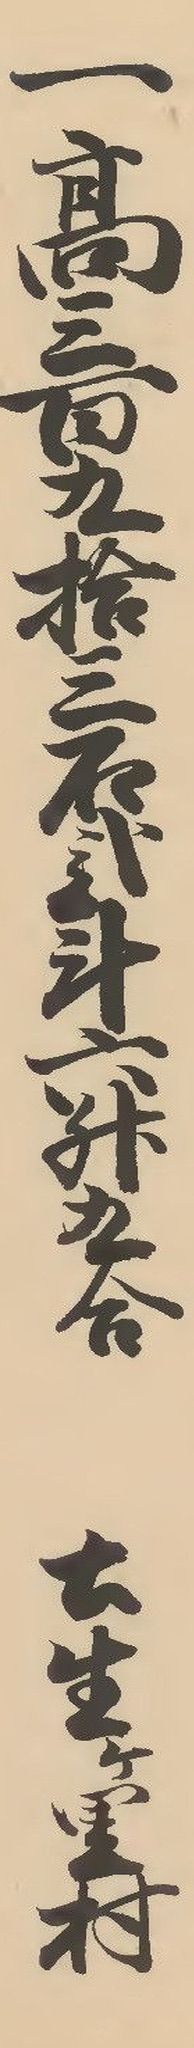一髙三百九拾三石弐斗六升九合土生ケ里村

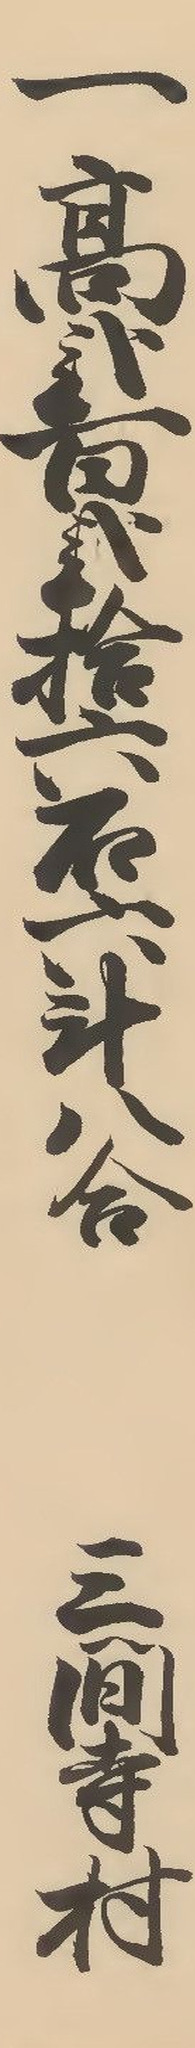一髙弐百弐拾六石六斗八合三間寺村
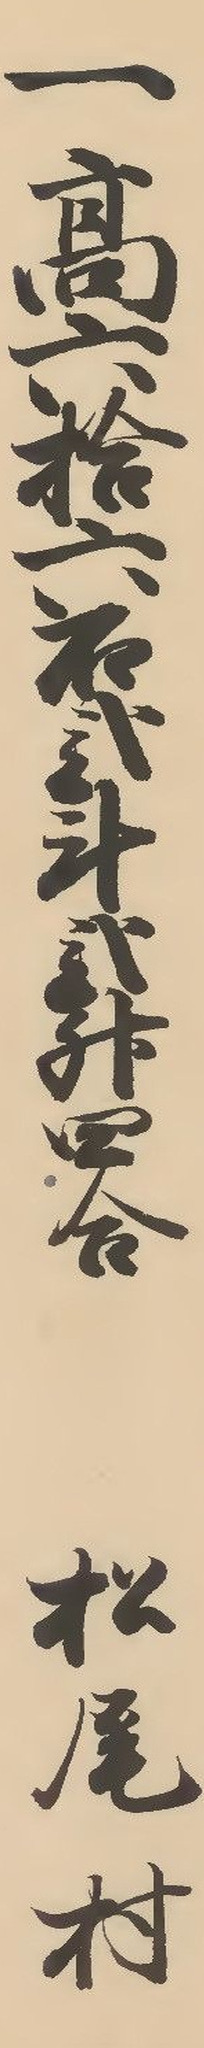一髙六拾六石弐斗弐升四合松尾村
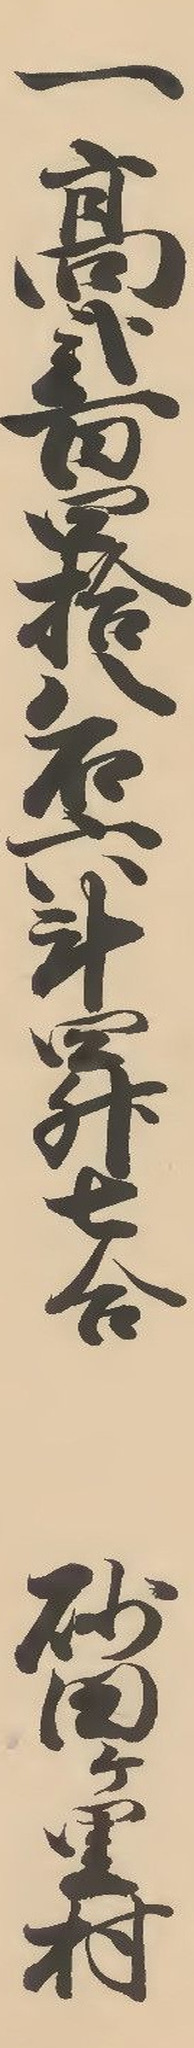一髙弐百四拾八石六斗四升七合砂田ケ里村
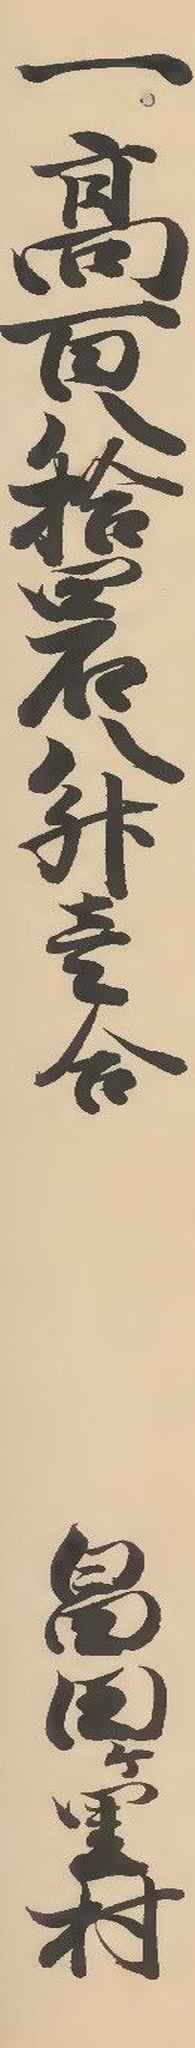一髙百八拾四石八升壱合畠田ケ里村
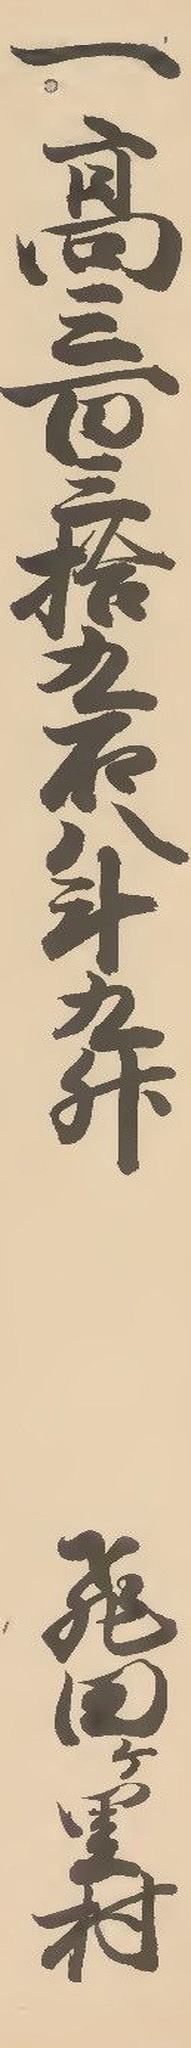一髙三百三拾九石八斗九升飛田ケ里村
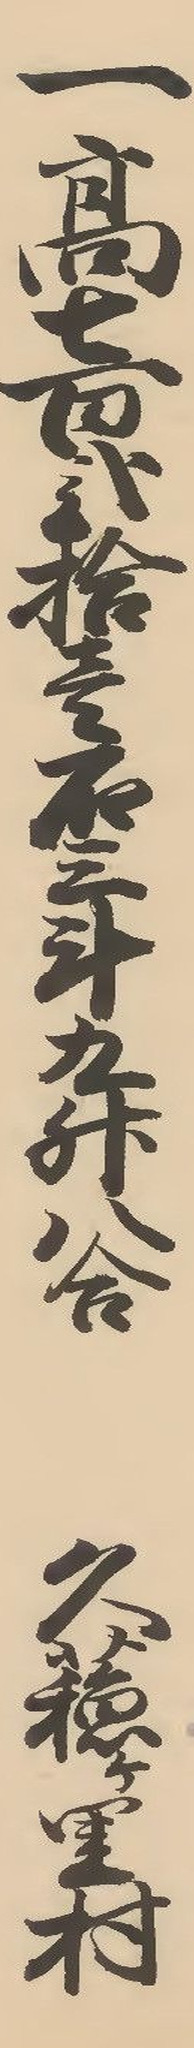一髙七百弐拾壱石三斗九升八合久ケ里村
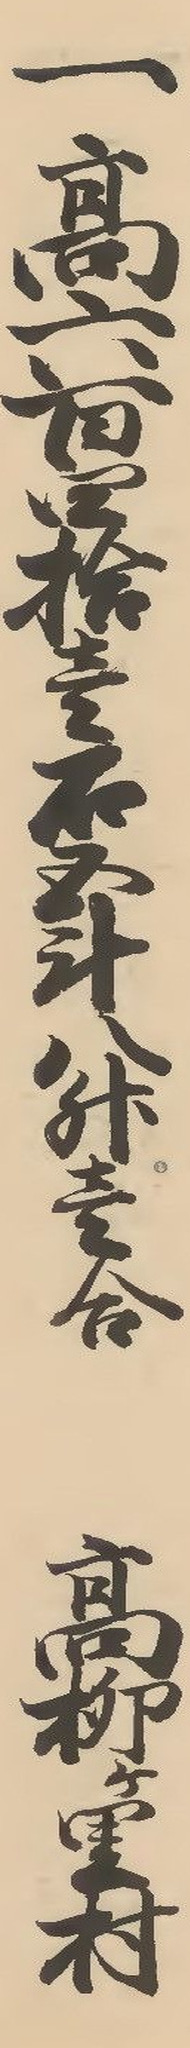一髙六百四拾壱石五斗八升壱合髙柳ケ里村
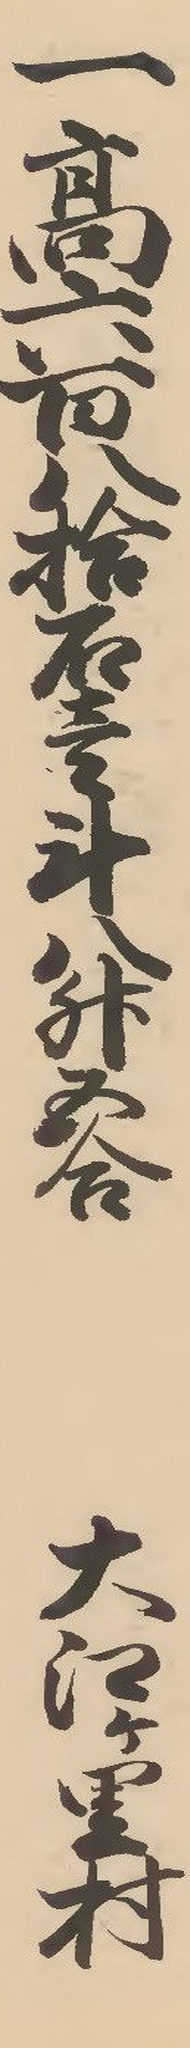一髙六百八拾石壱斗八升五合大江ケ里村

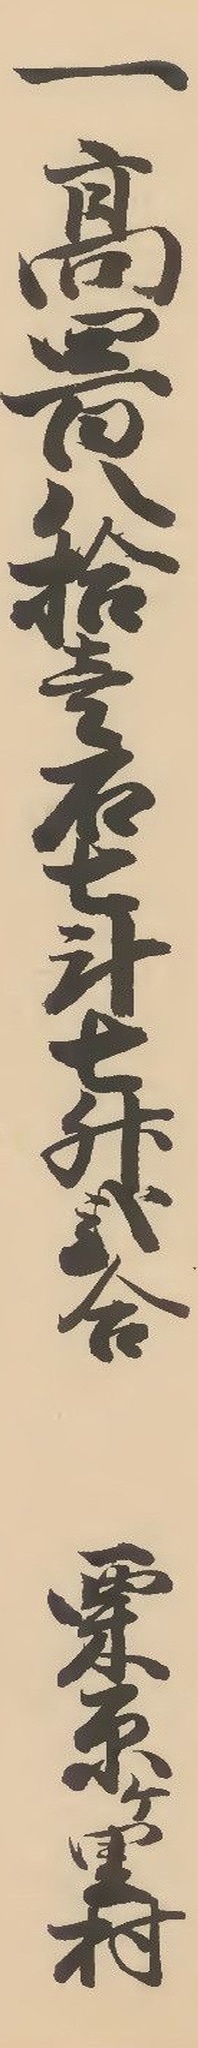一髙四百八拾壱石七斗七升弐合栗原ケ里村
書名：肥前国郷帳
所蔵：国立公文書館 National Archives of Japan
